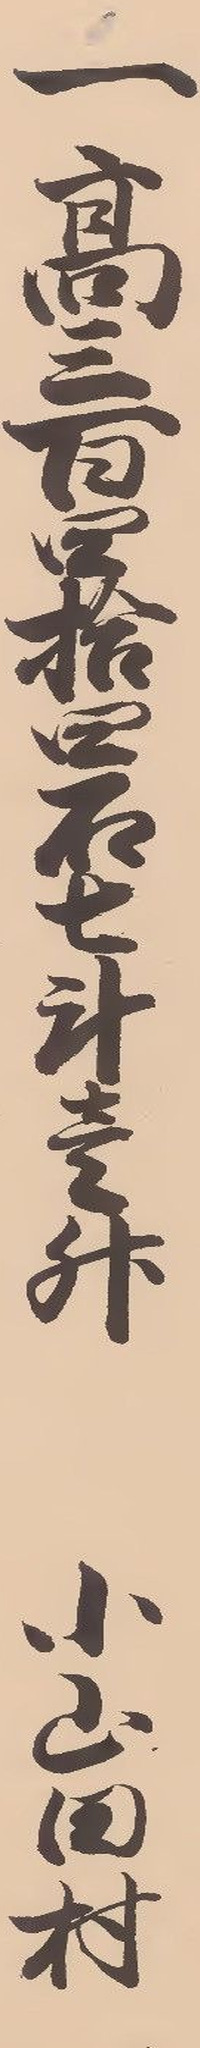一高三百四拾四石七斗壱升小山田村
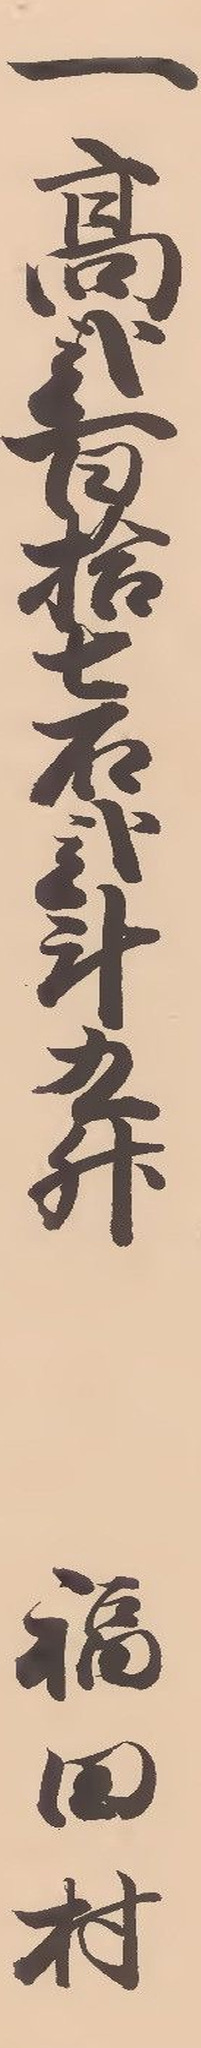一高弐百拾七石弐斗九升福田村
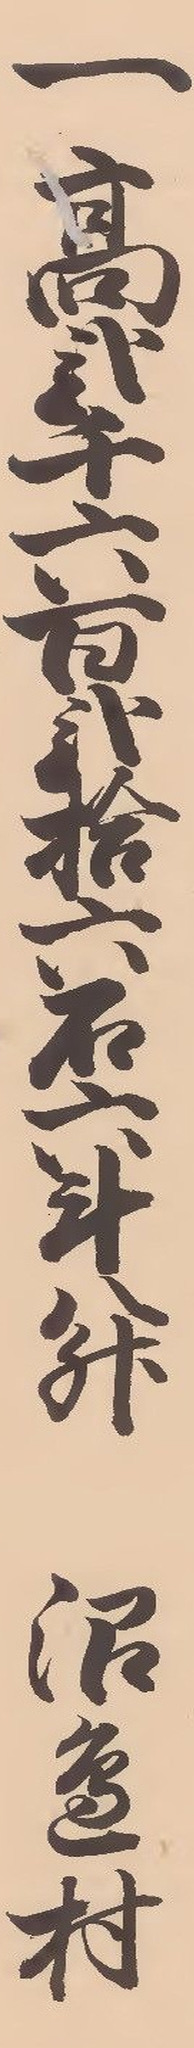一高弐千六百弐拾六石六斗八升沼辺村

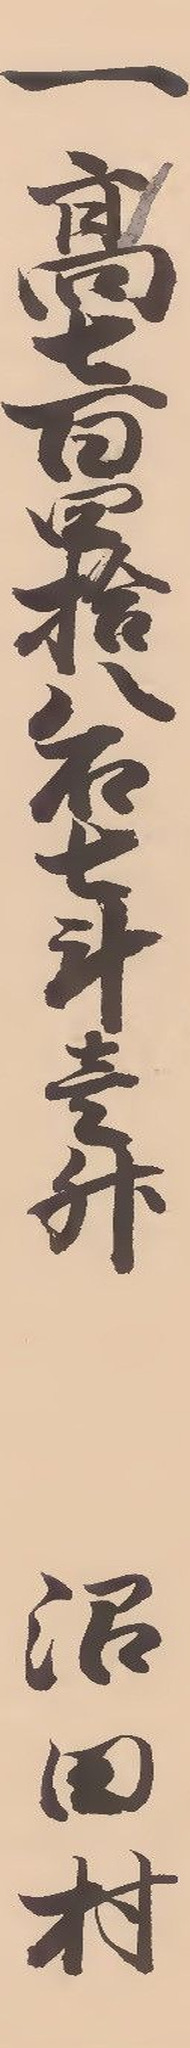一高七百四拾八石七斗壱升沼田村
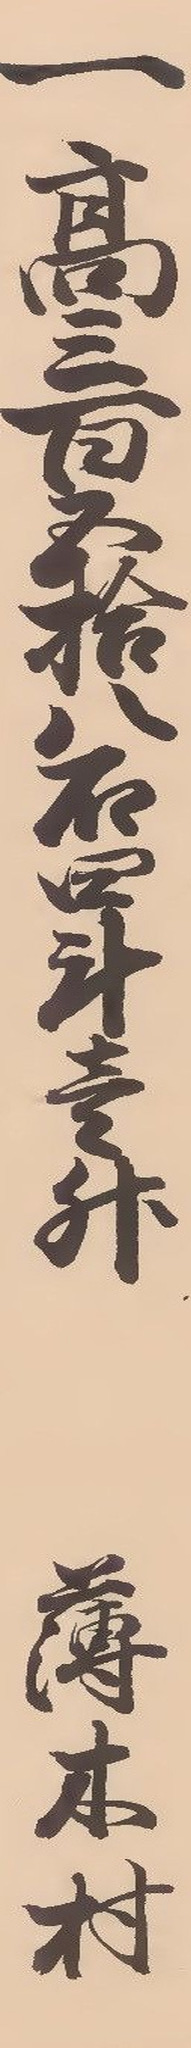一高三百五拾八石四斗壱升薄木村
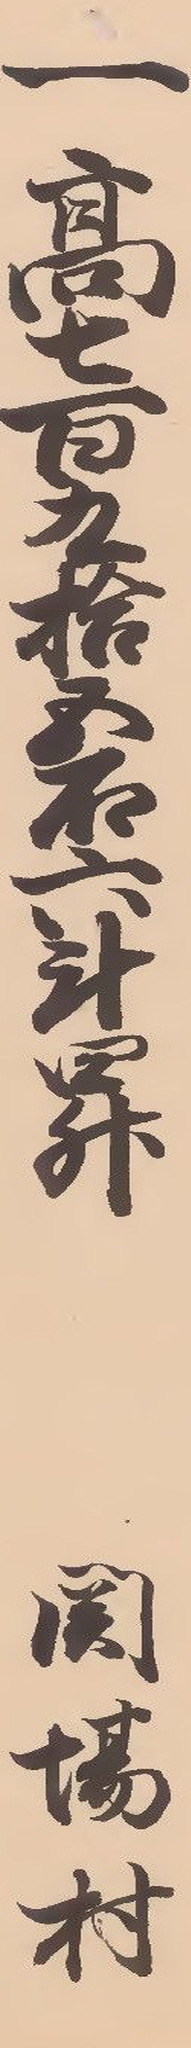一高七百九拾五石六斗四升関場村
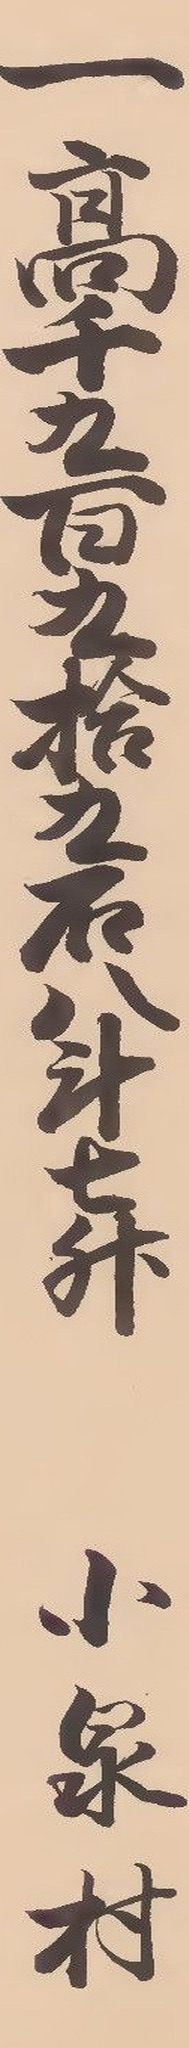一高千九百九拾九石八斗七升小泉村
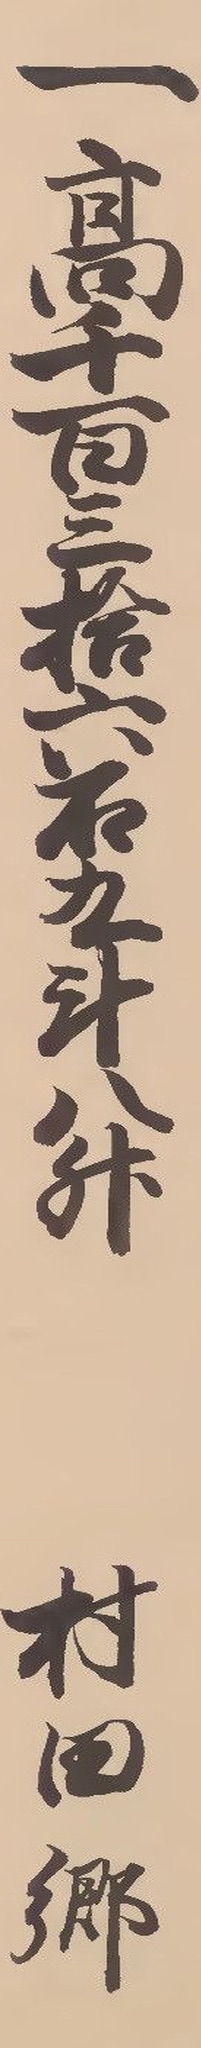一高千百三拾六石九斗八升村田郷
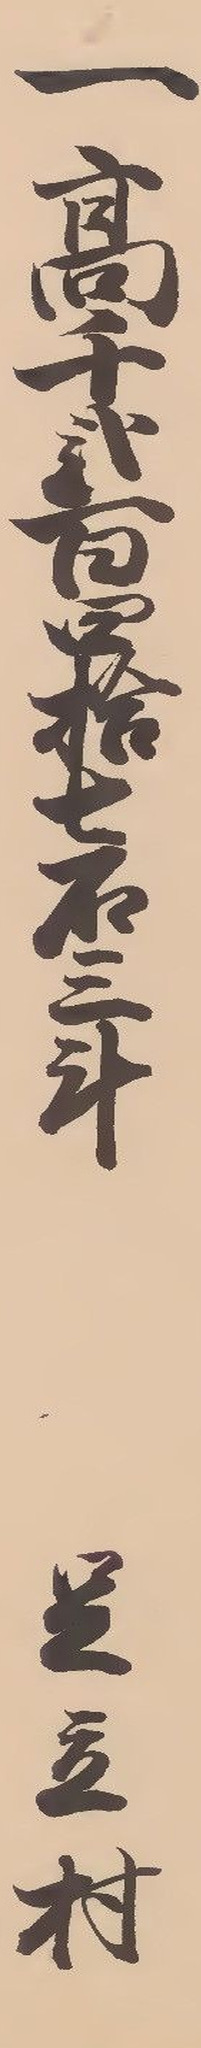一高千弐百四拾七石三斗足立村
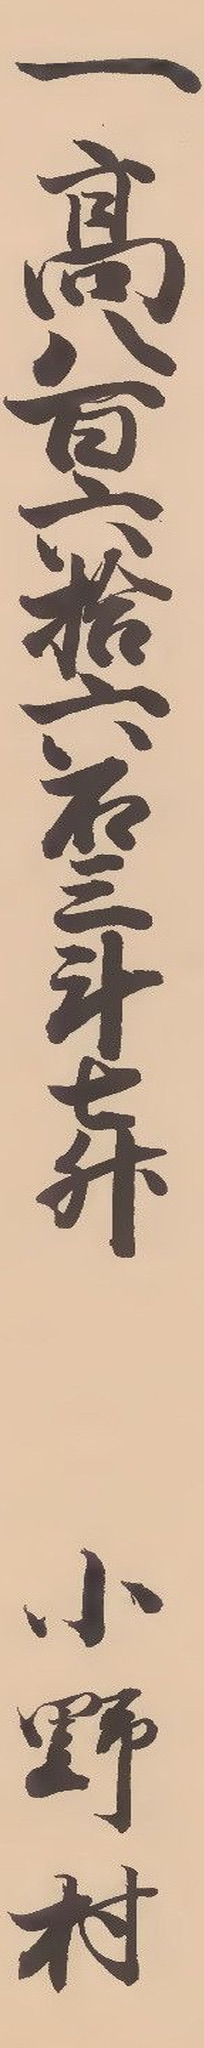一高八百六拾六石三斗七升小野村
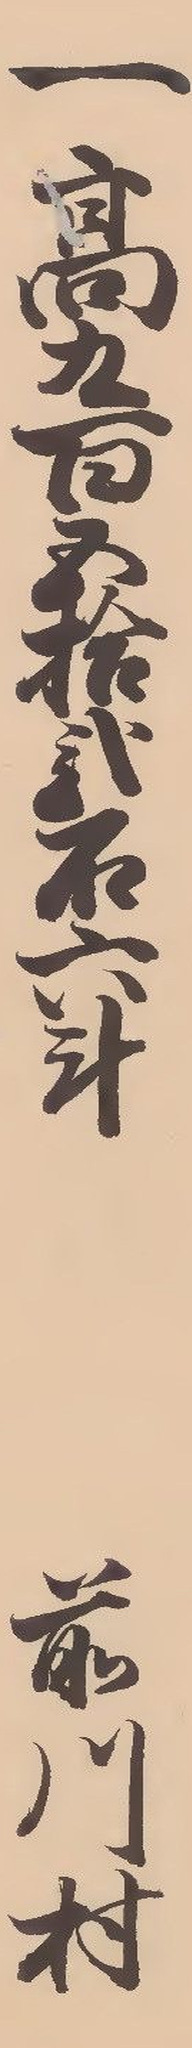一高九百五拾弐石六斗前川村

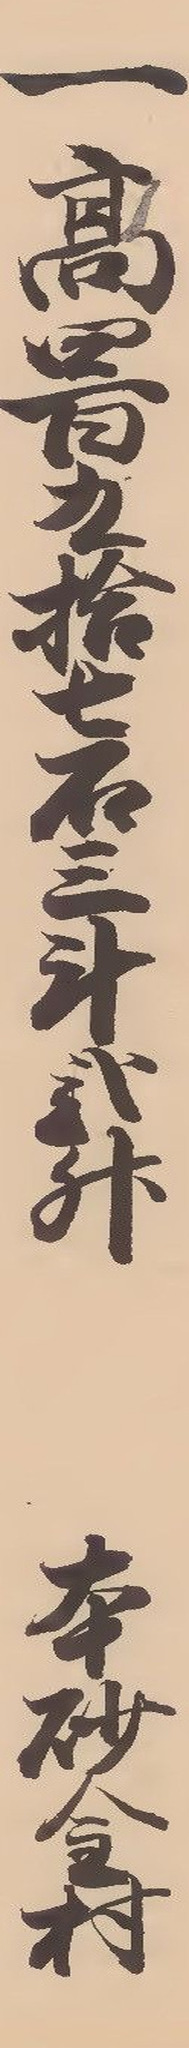一高四百九拾七石三斗弐升本砂金村
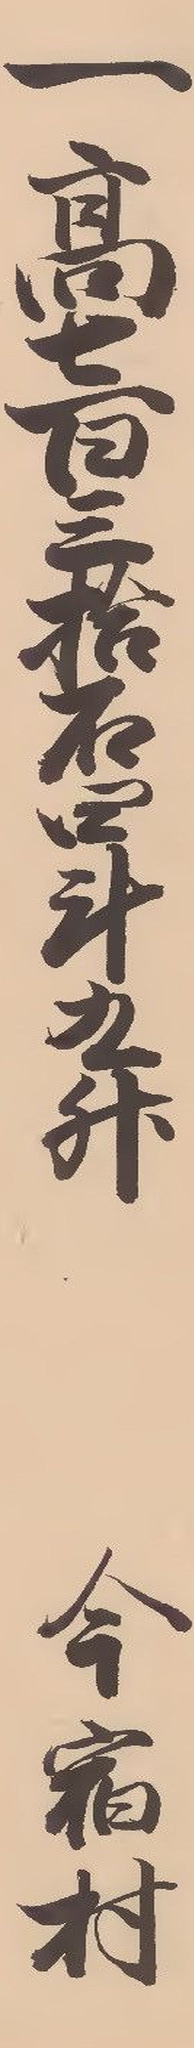一高七百三拾石四斗九升今宿村
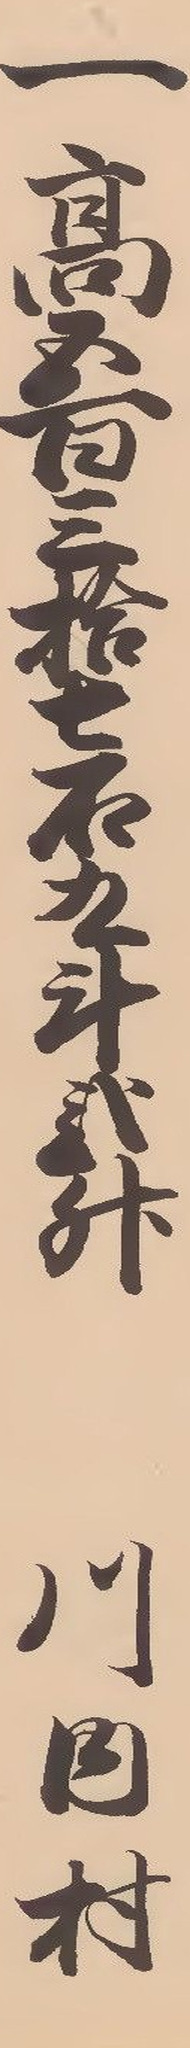一高五百三拾七石九斗弐升川内村
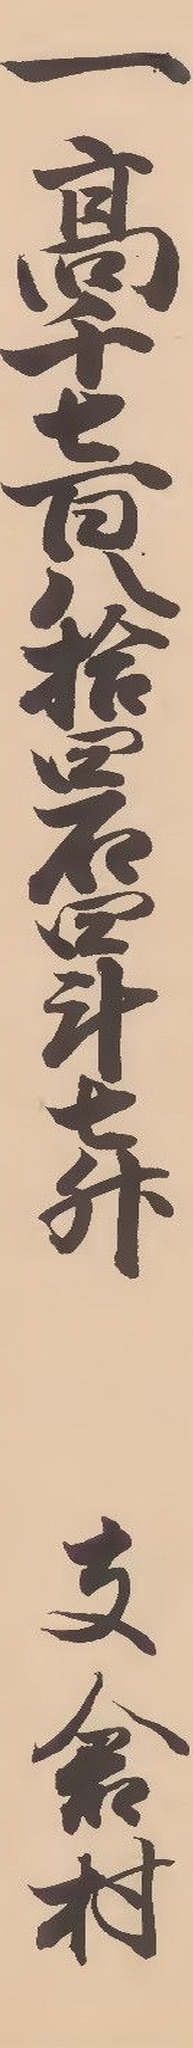一高千七百八拾四石四斗七升支倉村
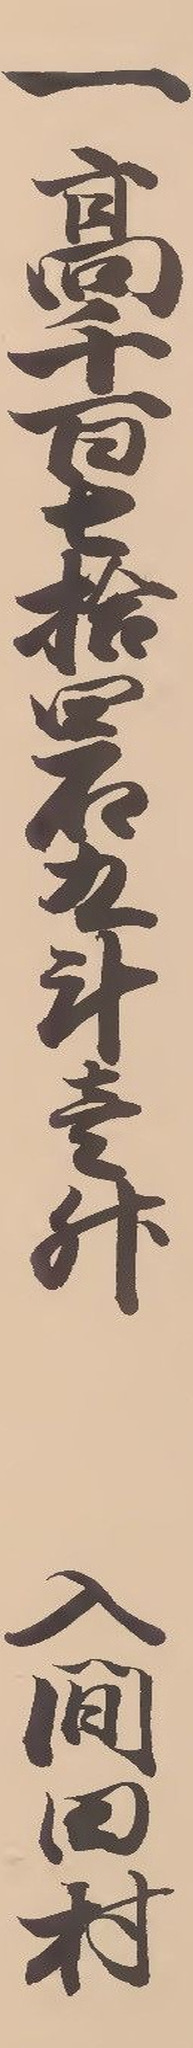一高千百七拾四石九斗壱升入間田村
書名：陸奥国郷帳　５
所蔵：国立公文書館 National Archives of Japan
